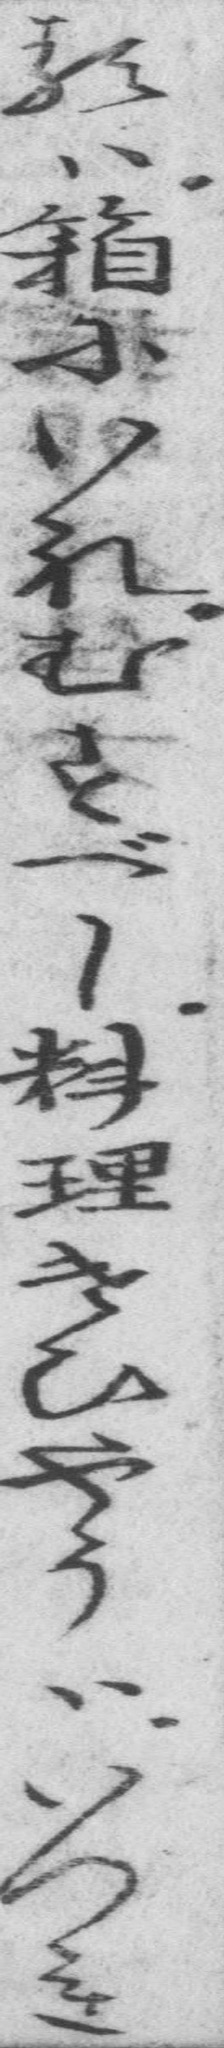類は。箱にいれ。むすべし。料理遣ひやうは。いつれ
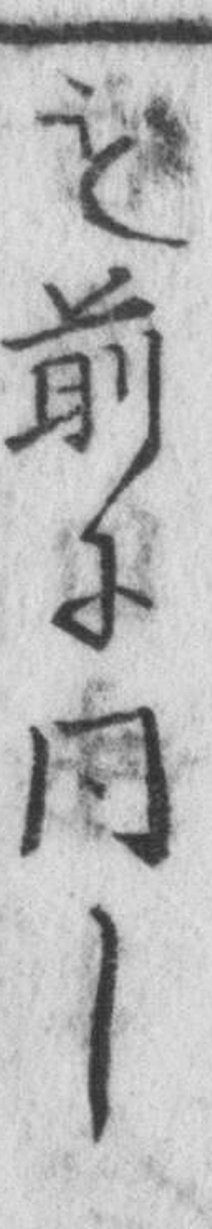も前に同し
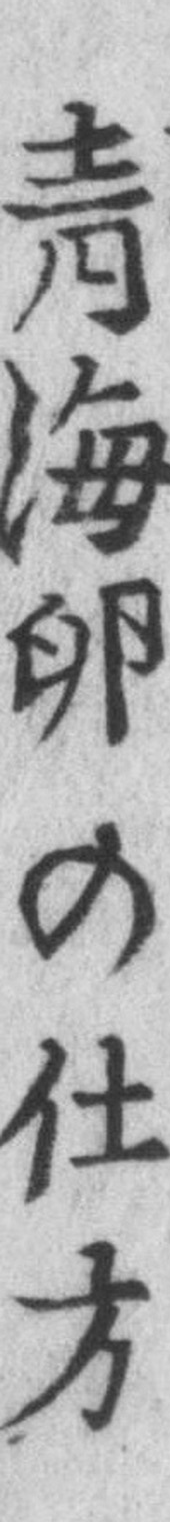青海卵の仕方

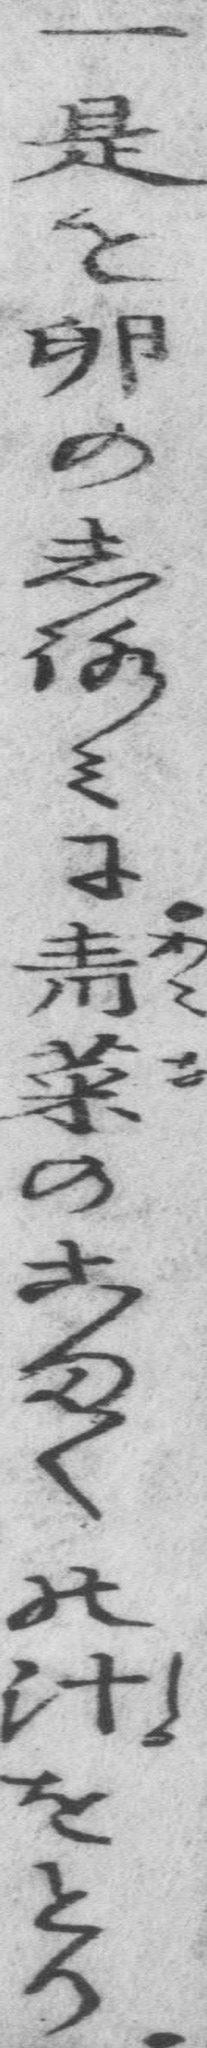一是も卵のしろみに。青菜のこま〳〵の汁をとり。
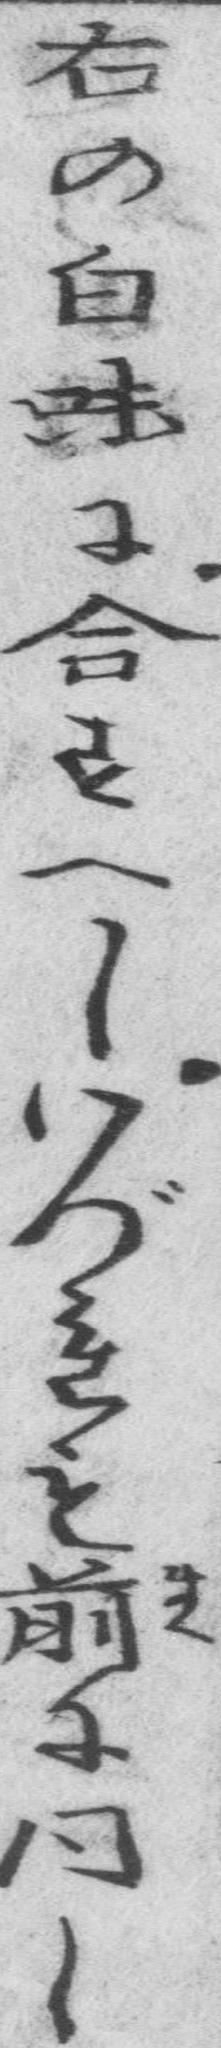右の白味に。合すへし。いづれも前に同し
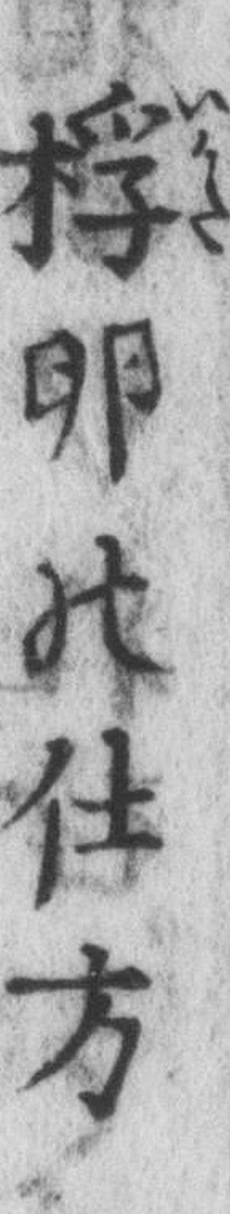桴卵の仕方
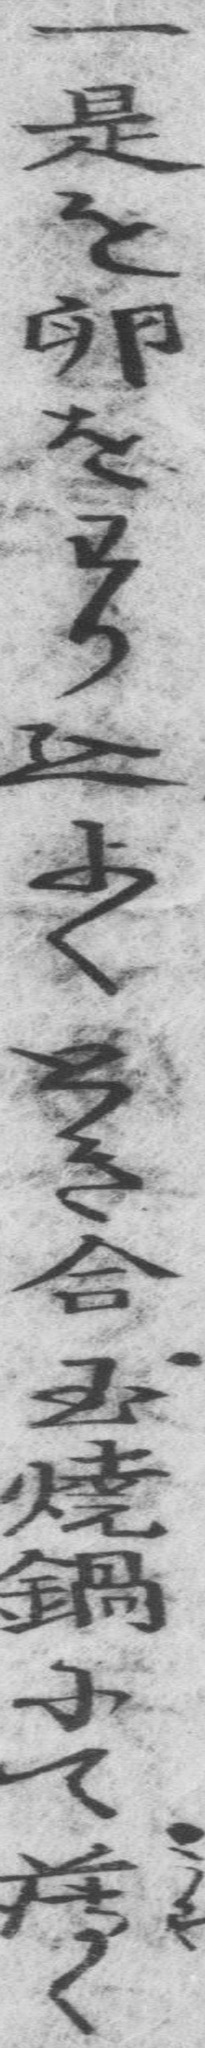一是も。卵をわり込よくとき合。玉焼鍋にて薄く
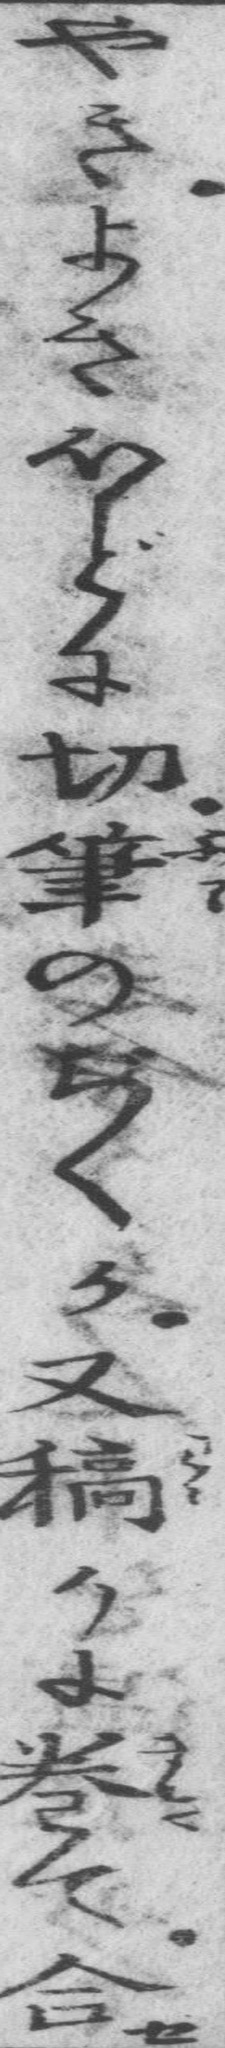やき。よきほどに切。筆のぢくか。又稿かに巻て。合せ
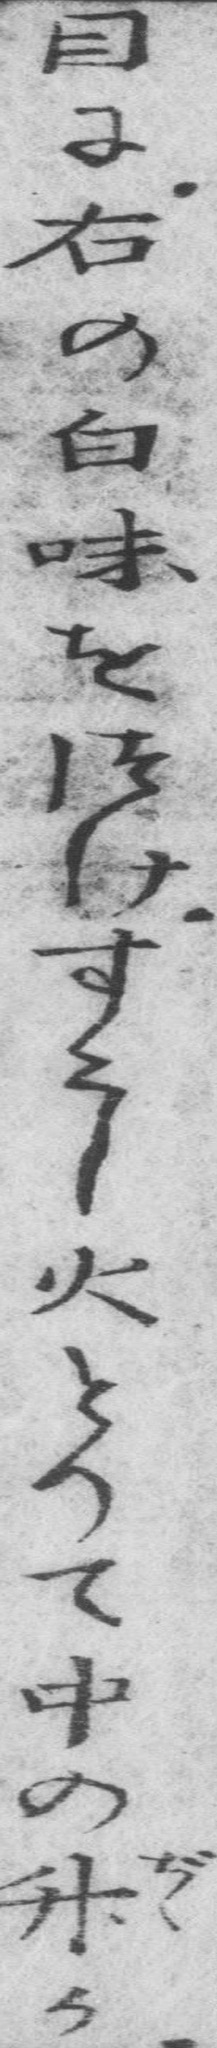目に。右の白味をつけ。すこし火とりて中の竹か。
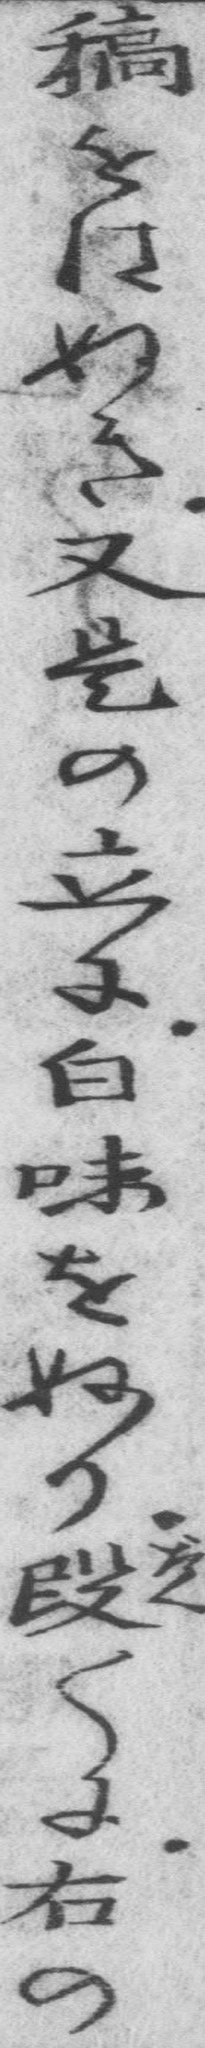稿をはぬき。又是の立に。白味をぬり、段〳〵に。右の
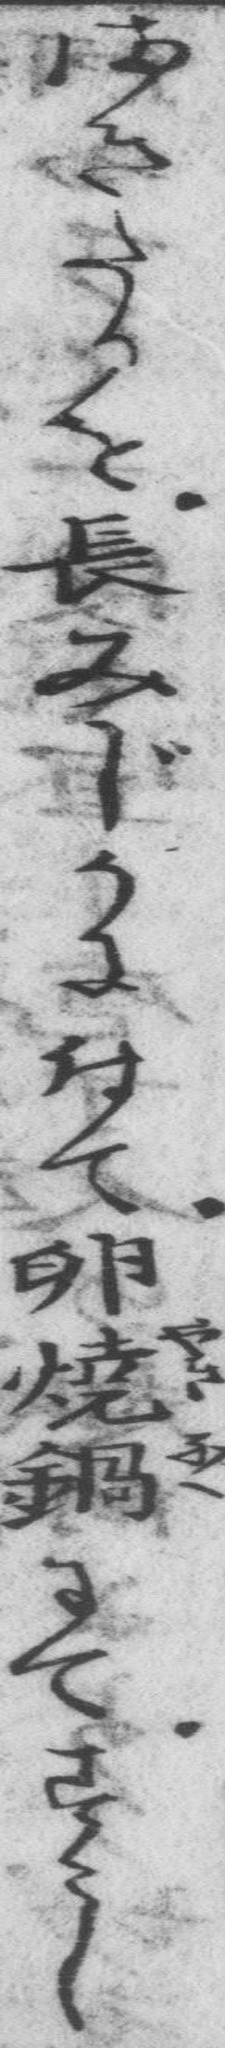まきたるを。長みじかに付て。卵焼鍋にて。すこし
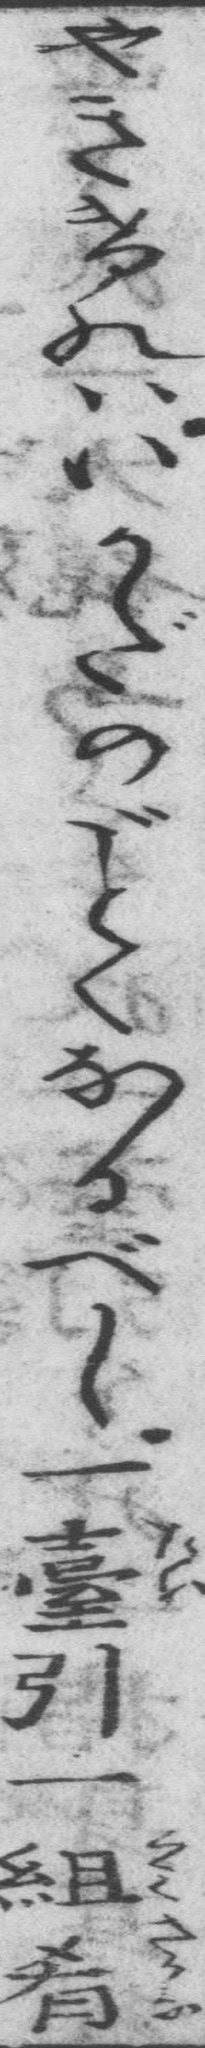やきけれは。いかだのごとくなるべし。一台引一組肴
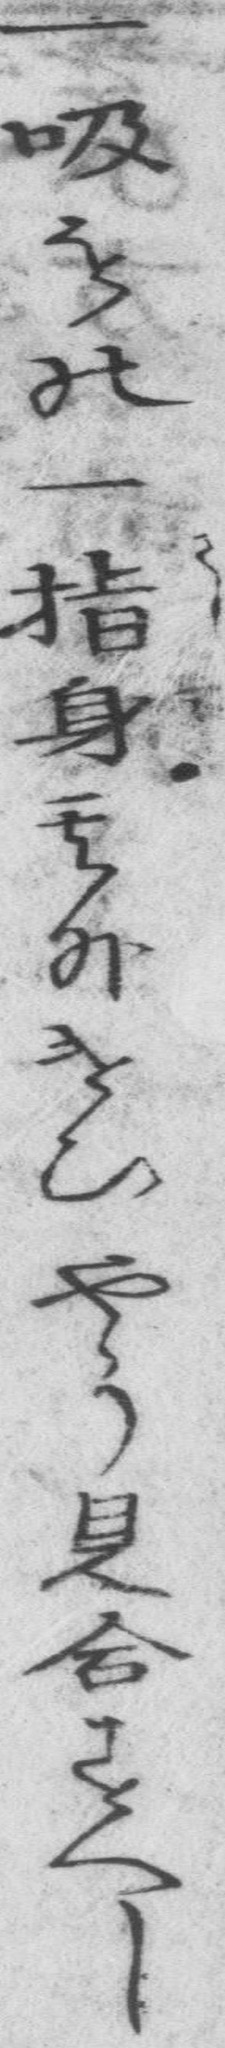一吸もの一指身。其外遣ひやう見合すへし
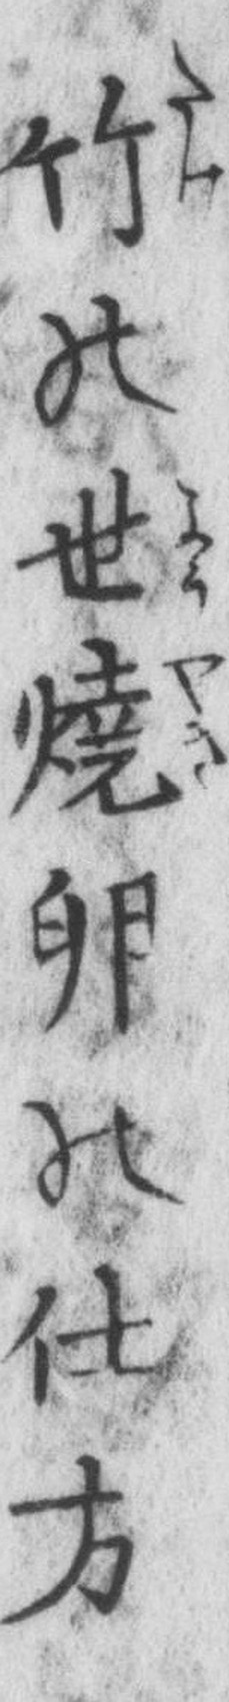竹の世焼卵の仕方
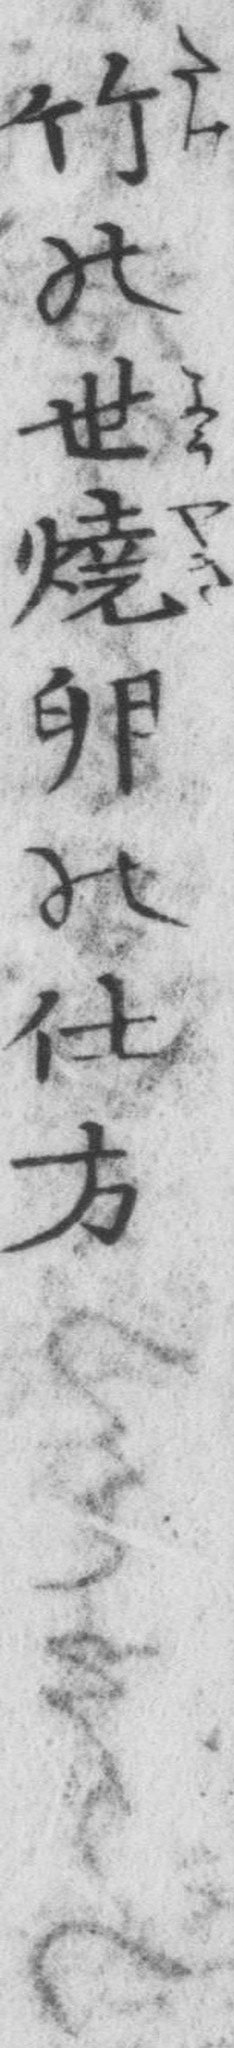竹の世焼卵の仕方
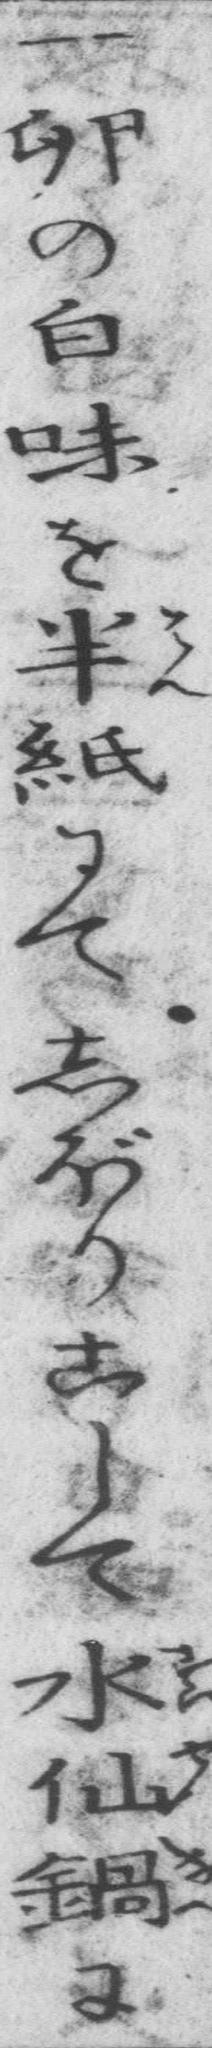一卵の白味を半紙にて。しぼりこして水仙鍋に
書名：萬寳料理秘密箱
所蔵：大阪府立大学学術情報センター 国文学研究資料館
